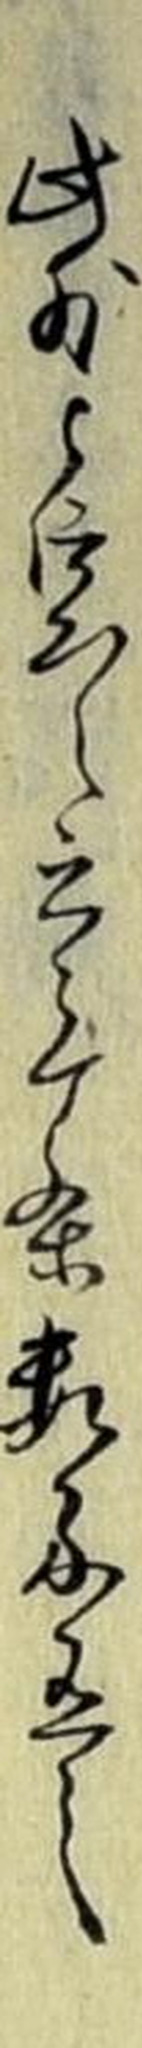此外被仰出之云々ケ条数多有之
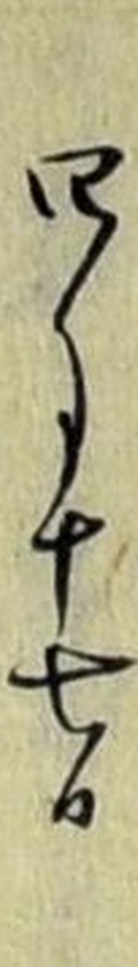四月十七日
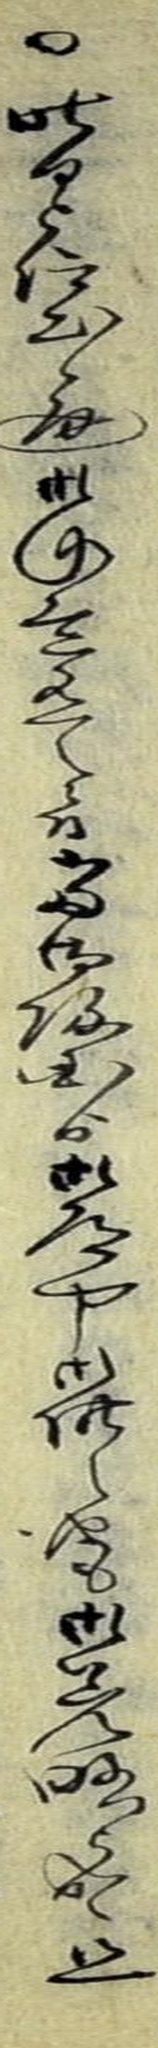〇昨日被仰出候通御趣意有之に付当御帰国ゟ御道中御供之儀も御差略被成候且
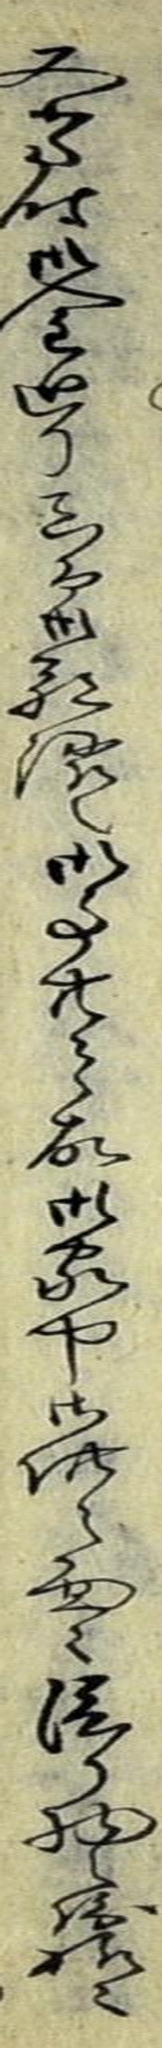又当時御金廻り至而御難渋之御事共に候故御家中御供之面々渡り物之儀様々
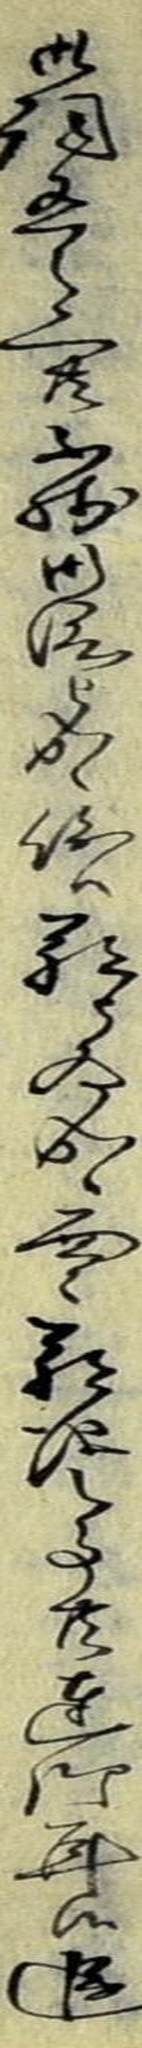御調有之候へ共不残御渡被成候儀は難被為成候面々難儀之事共達御耳候追
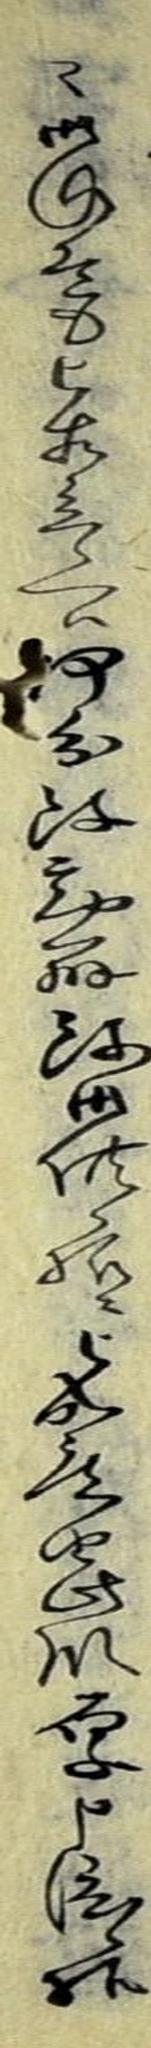々御趣意も被相立候ヘは何分致勘弁致御供候様に被成度由此段厚申渡候様
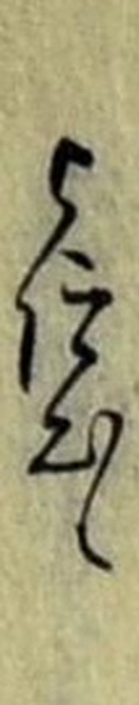被仰出候
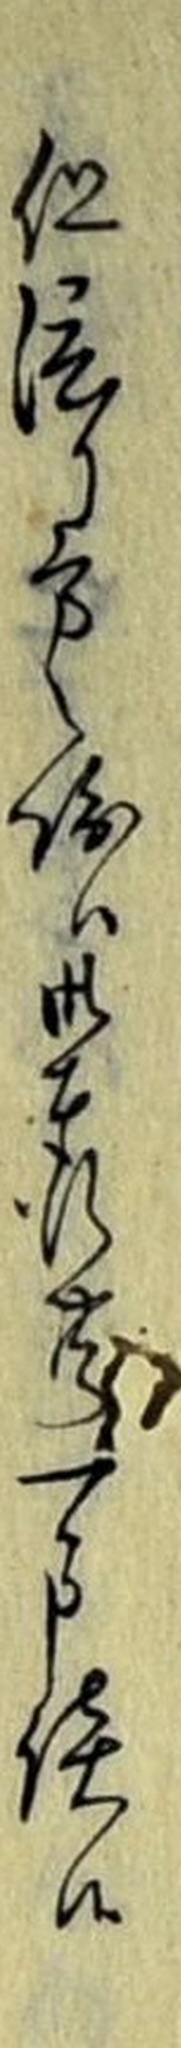但渡り方之儀は御奉行共可申談候

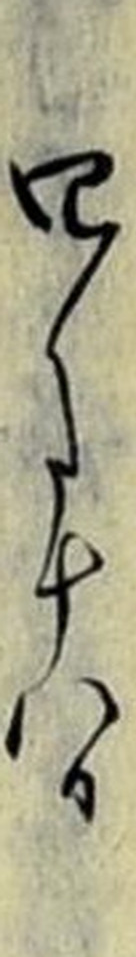四月十八日
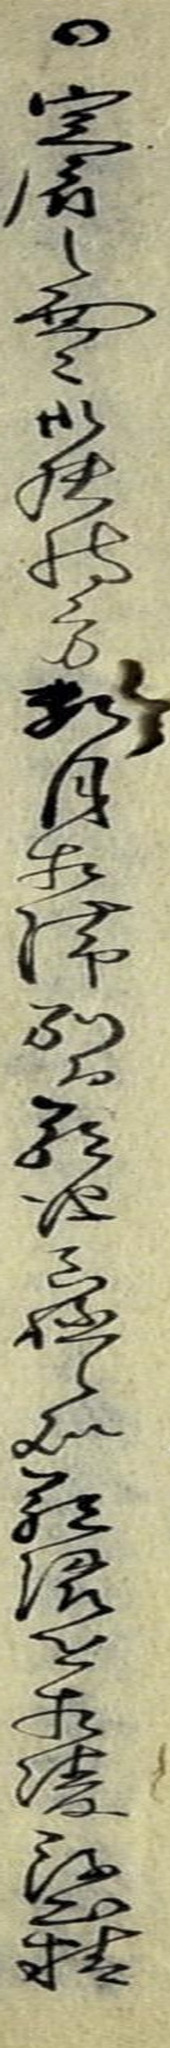〇常府之面々御扶持方数月相滞別而難儀至極之処難渋を相凌致出精
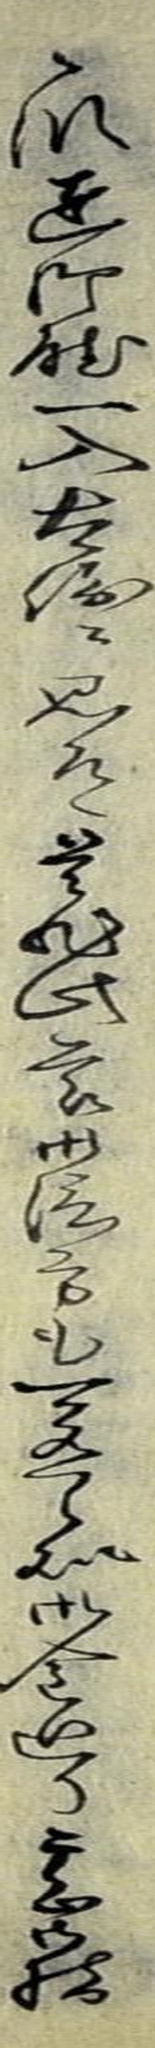候段達御聴一入太儀に思召候是非此節御渡方も可有之候御金廻り甚御指
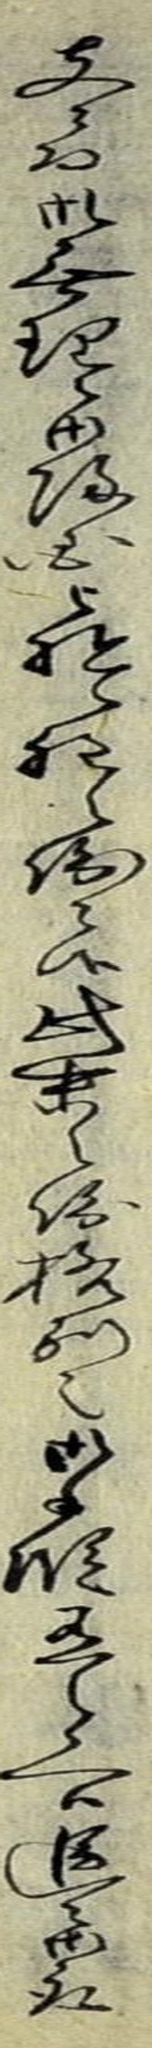支に而御無理之御帰国被遊候程之儀に候此末之儀格別之御手段有之候ヘハ追々御取
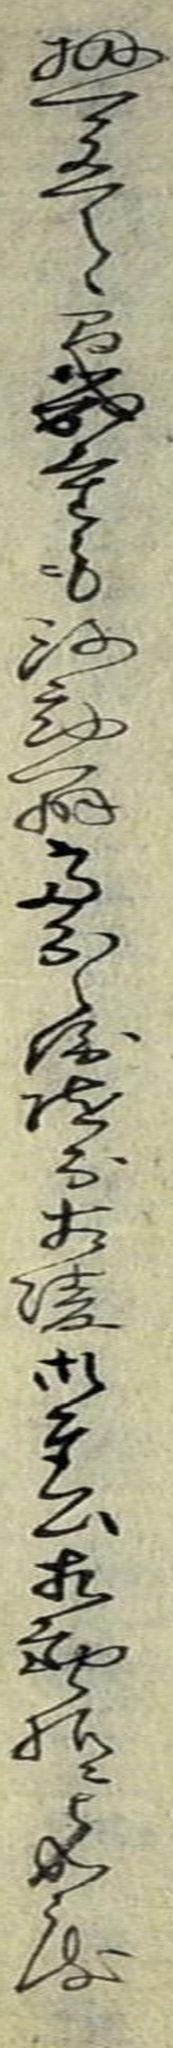扱可有之候間幾重にも致勘弁当分之儀随分相凌御奉公相勤候様に被成度
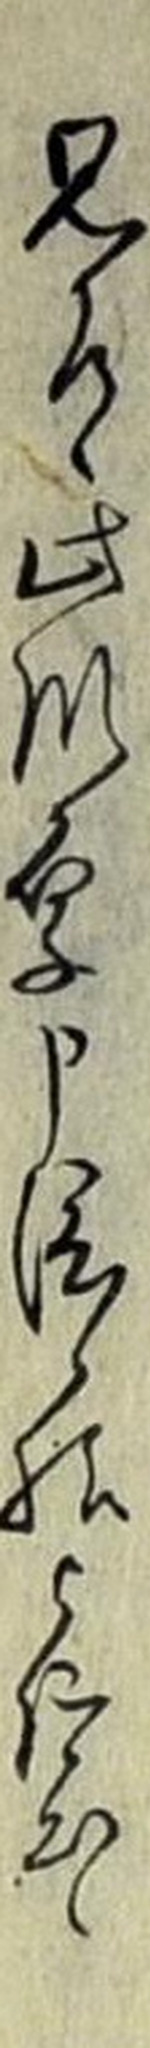思召候此段厚申渡候様被仰出候
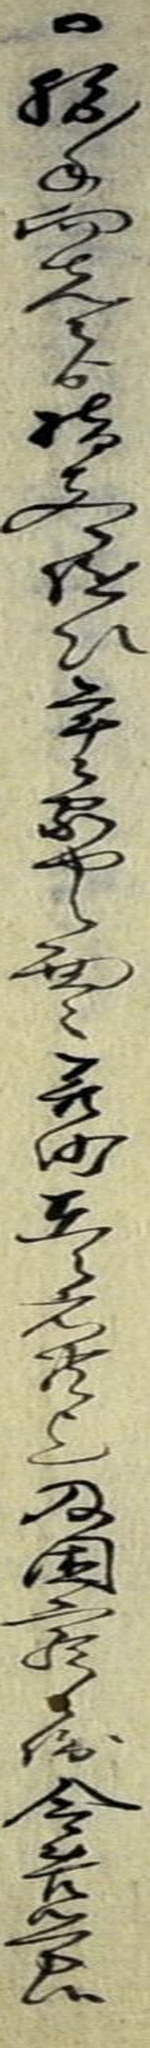〇勝手向先々ゟ指支に随ひ年々家中之面々并町在之者共迄及困窮之儀令苦労候
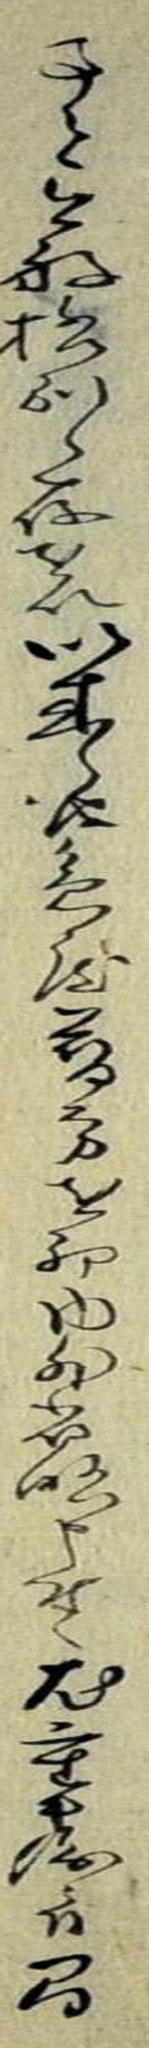事と今般格別之存を以以来之儀急度暮方を初内外省略申付候尤重き儀に付間
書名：命令之部 二
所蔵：福井県文書館 Fukui Prefectural Archives
